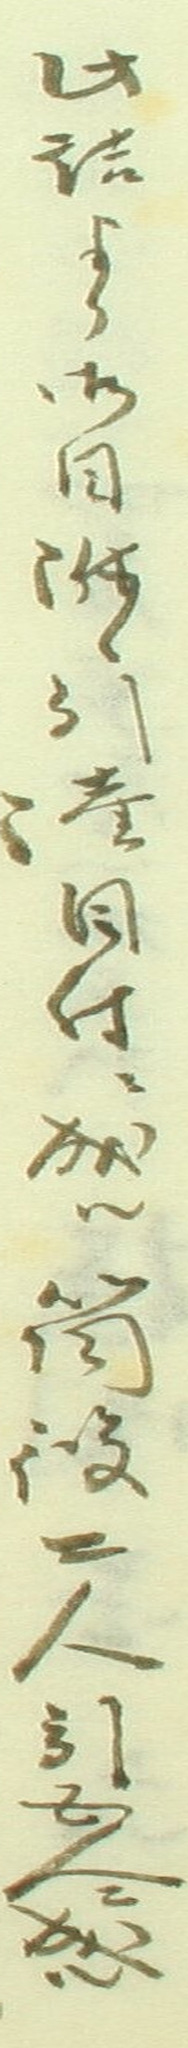此詰より御目附候引陸目付に成る筒役二人引五人に成る
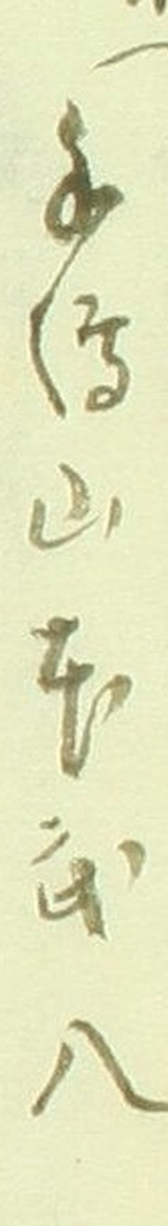手伝山本武八
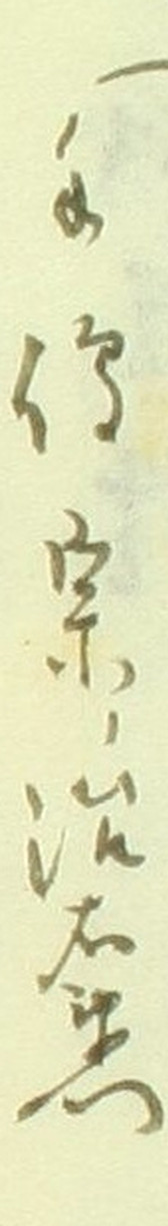手伝宗ノ治右衛門
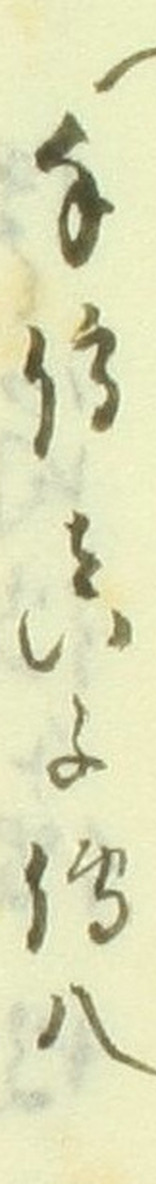手伝真子伝八
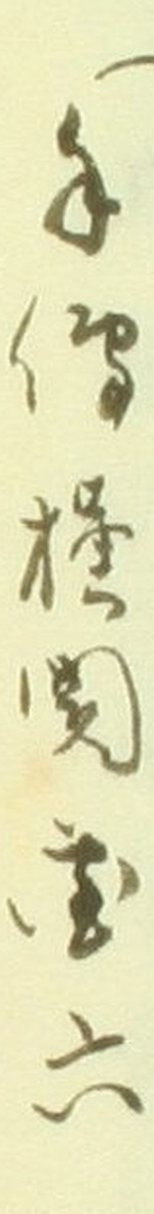手伝横関国六
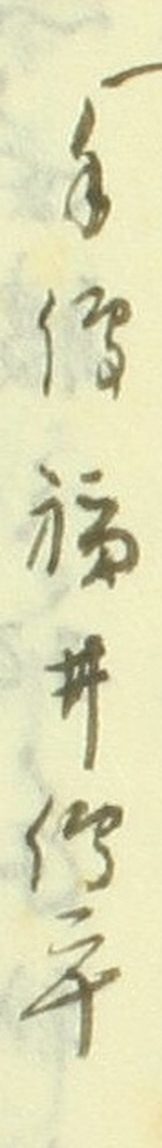手伝福井伝平
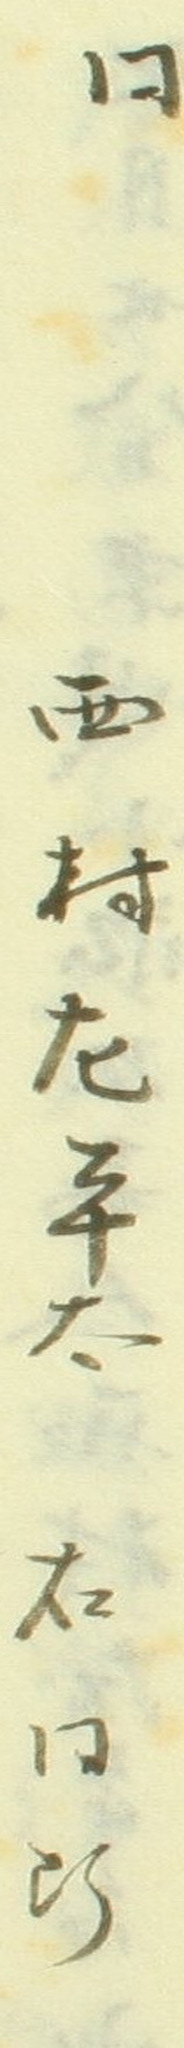一同西村左平太右同断
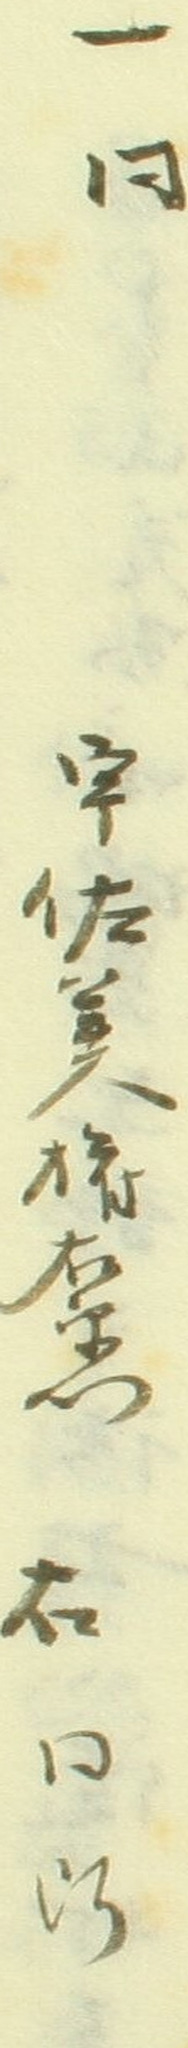一同宇佐美権右衛門右同断
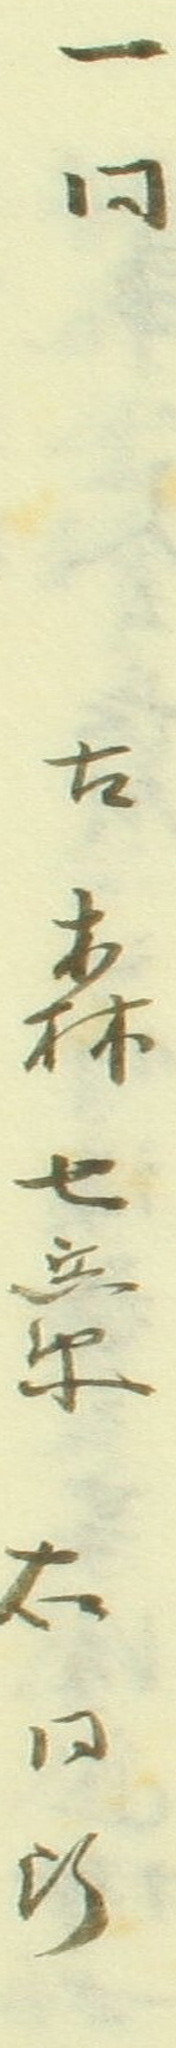一同古森七兵衛右同断
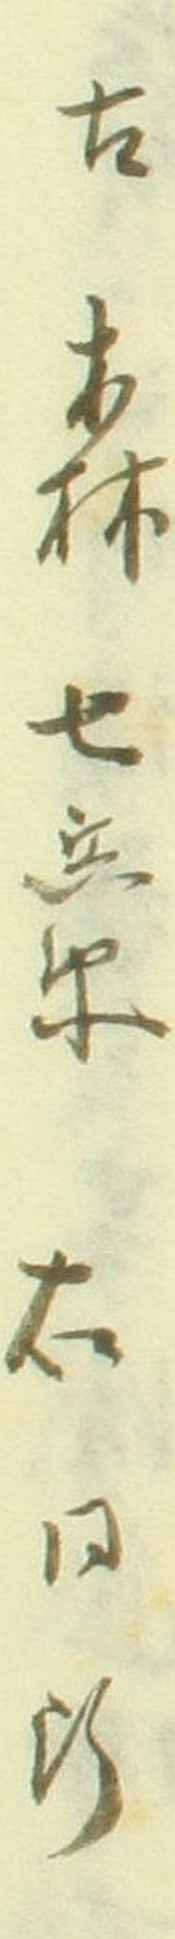一同古森七兵衛右同断
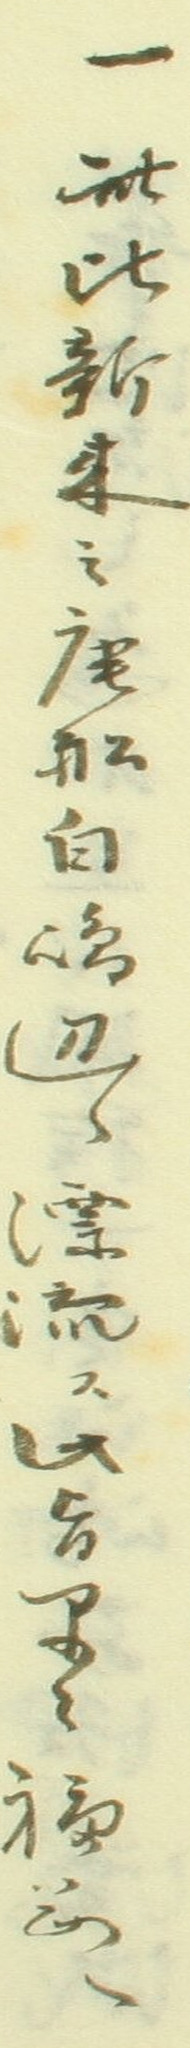一此頃新来之唐船白嶋辺へ漂流す此旨早々福岡へ
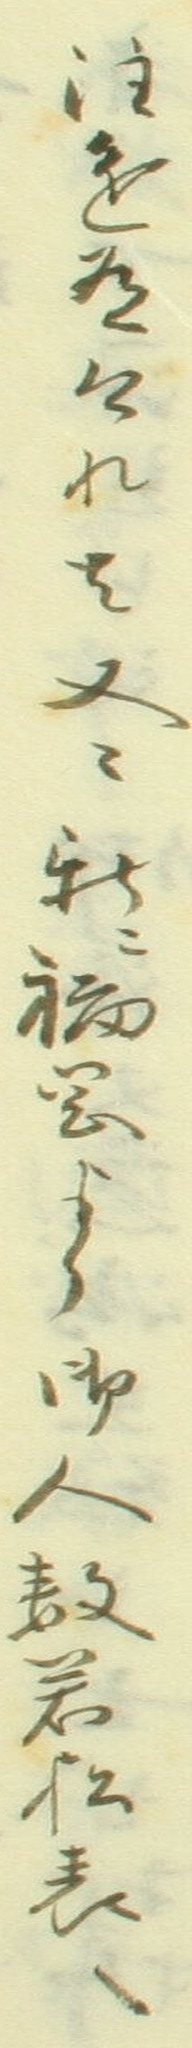注進有けれは又又新に福岡より御人数若松表へ
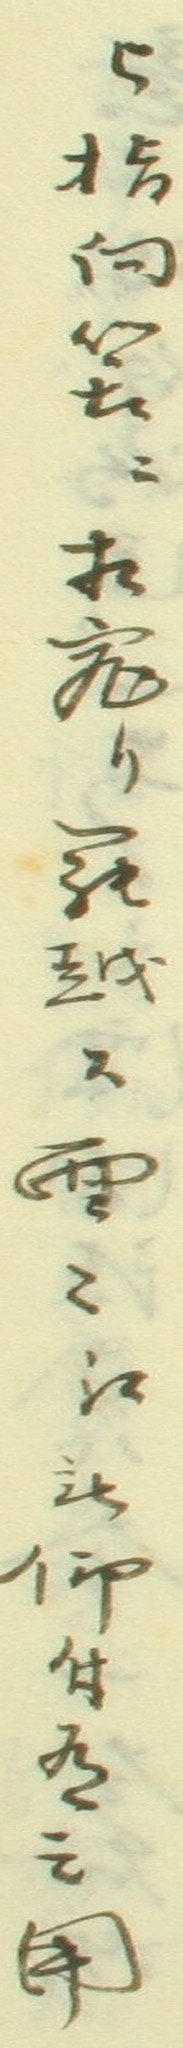被指向筈に相容り罷越す面々江被仰付有之用

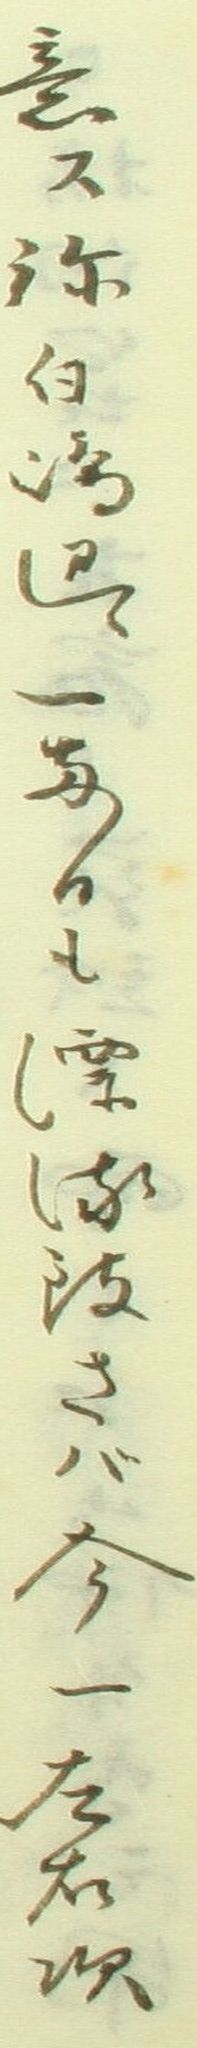意す弥白嶋退く一両日も漂流致さば今一左右次
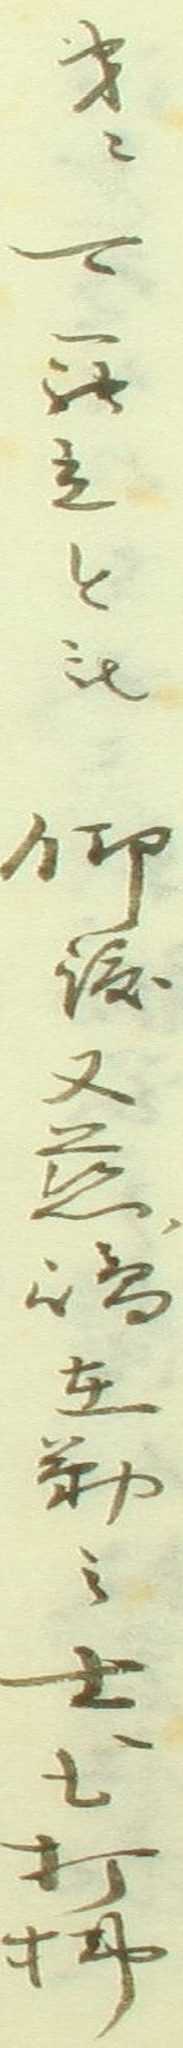第に可罷立と被仰渡又慈嶋在勤之士も打払
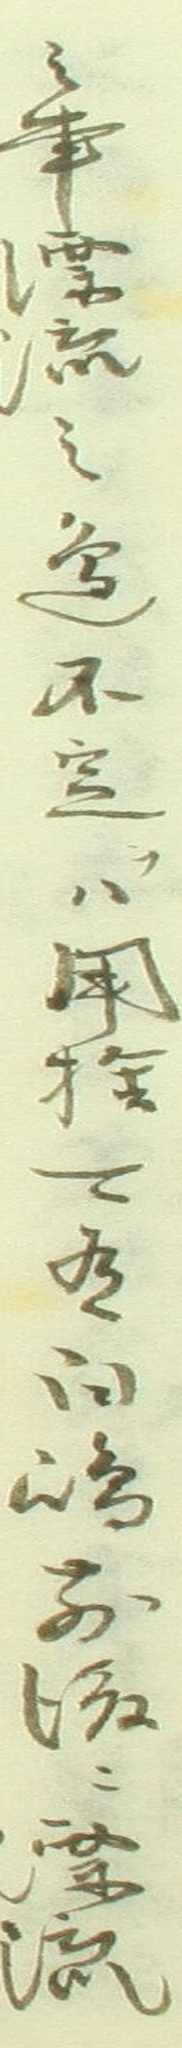之事漂流之辺不定をヲは用捨可有白嶋前後に漂流
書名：唐船漂流記 三
